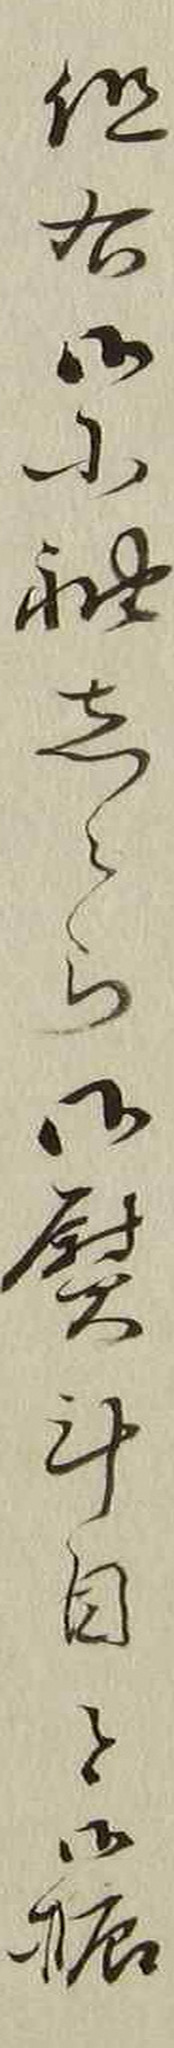但右御小袖しゝら御熨斗自と振
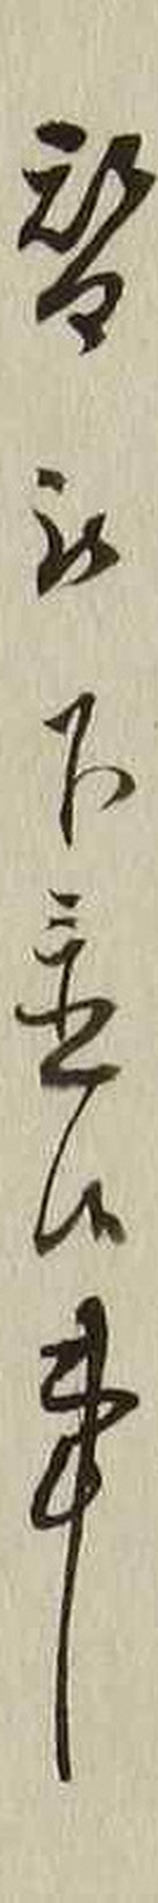替被下置候事
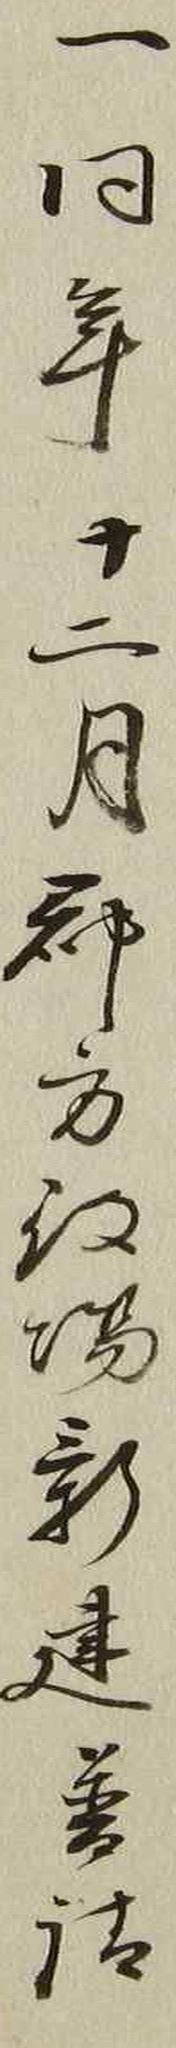一同年十二月郡方役場新建普請
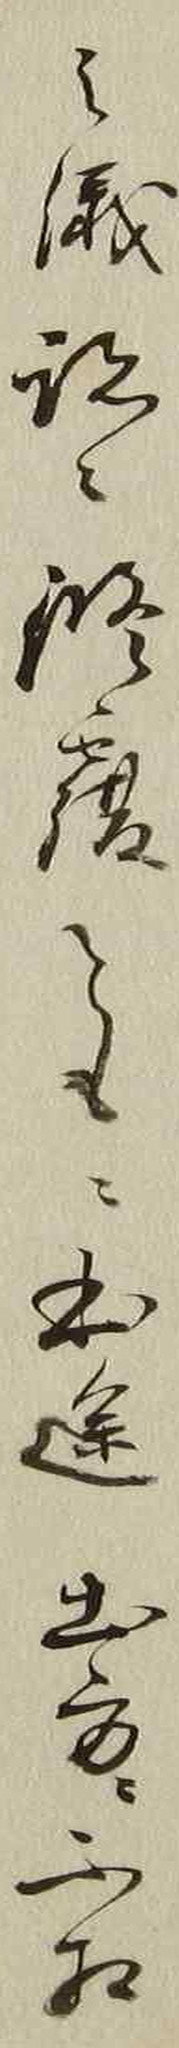之儀跡ニ修覆ともニ本途出方ニ不相
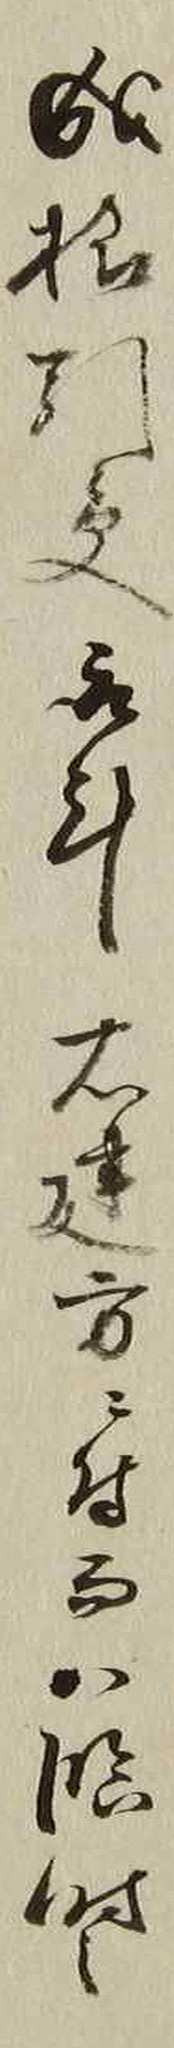成様引受取計右建方ニ付而ハ臨時之
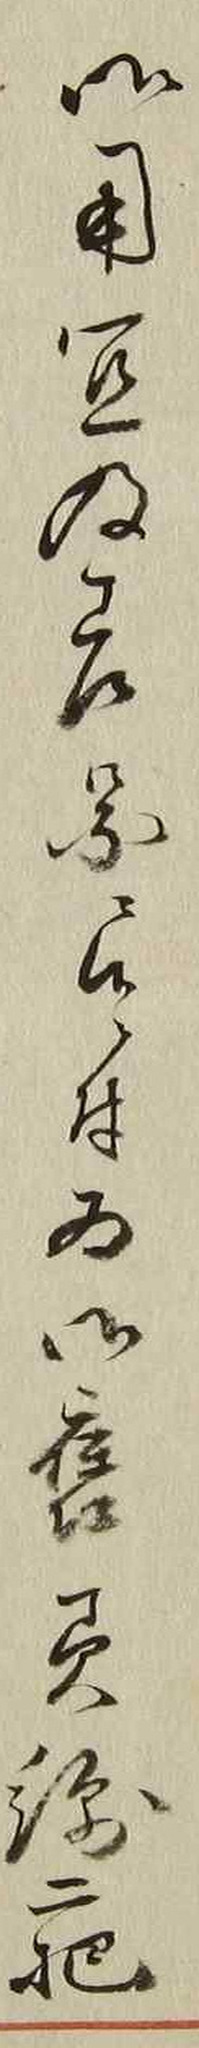御用宜及差図ニ候ニ付為御褒美綿二把
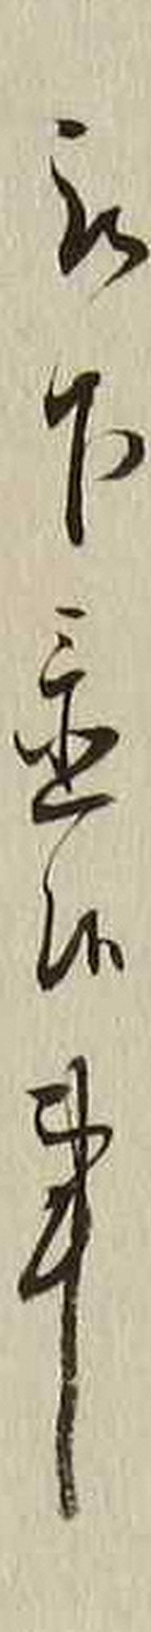被下置候事
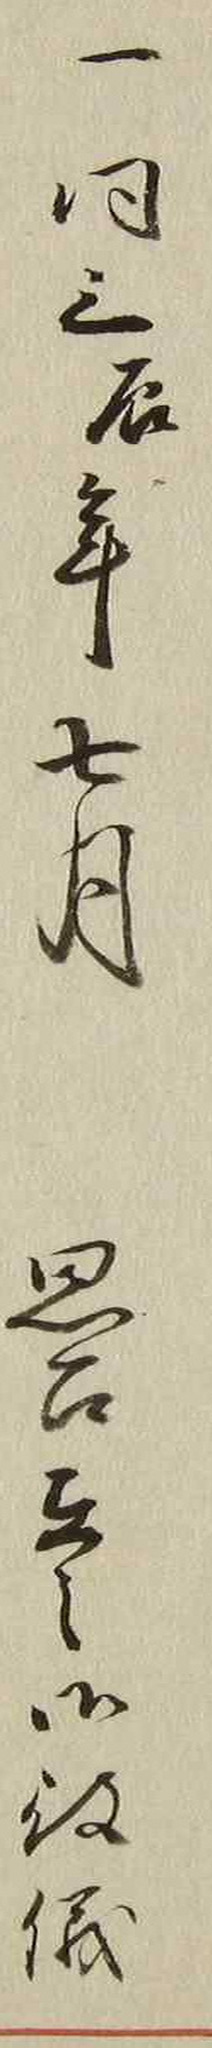一同三辰年七月思召在之御役儀
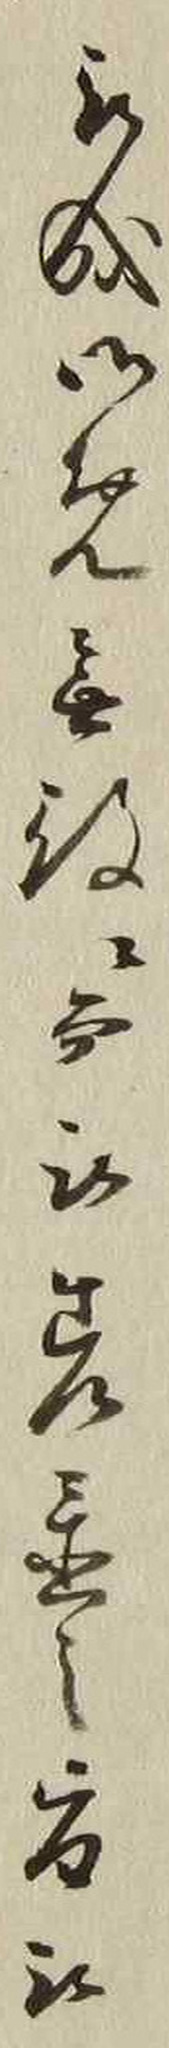被成御免無役ニ而被差置之旨被
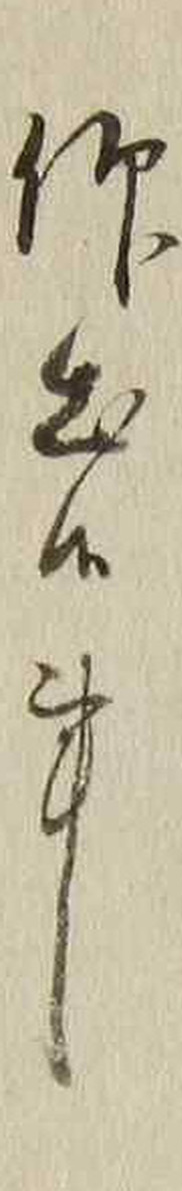仰出候事
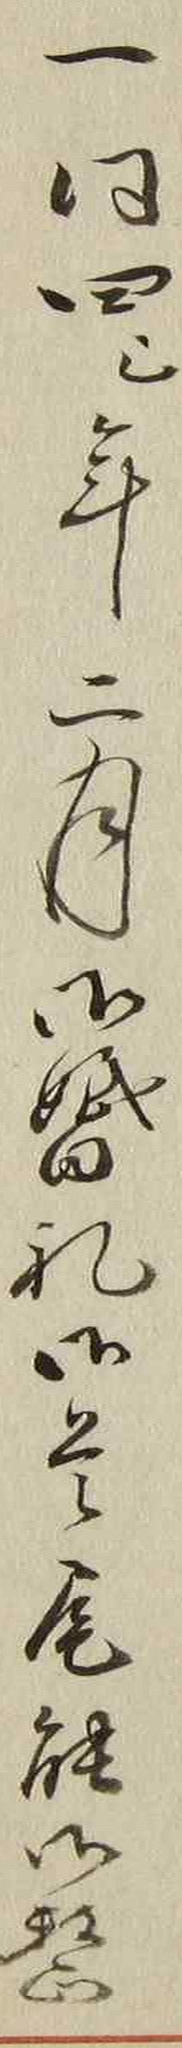一同四巳年二月婚礼御首尾能御整
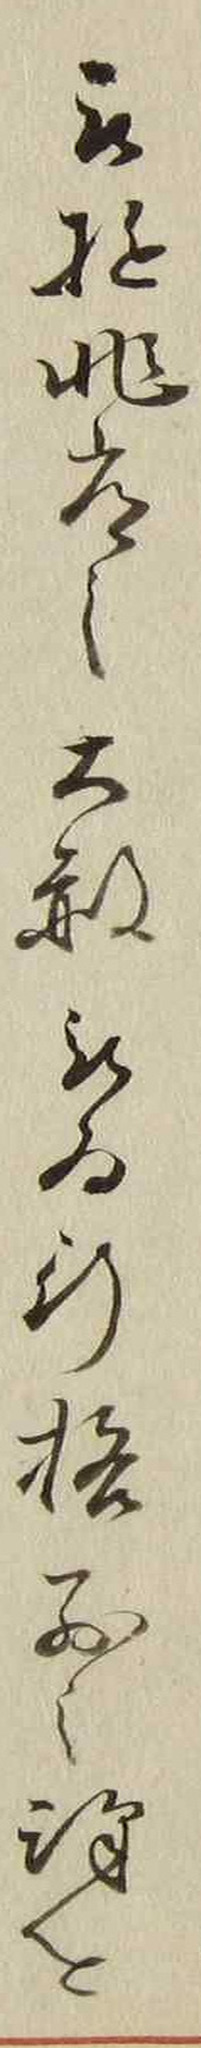被遊非常之大赦被為行格別之訳を
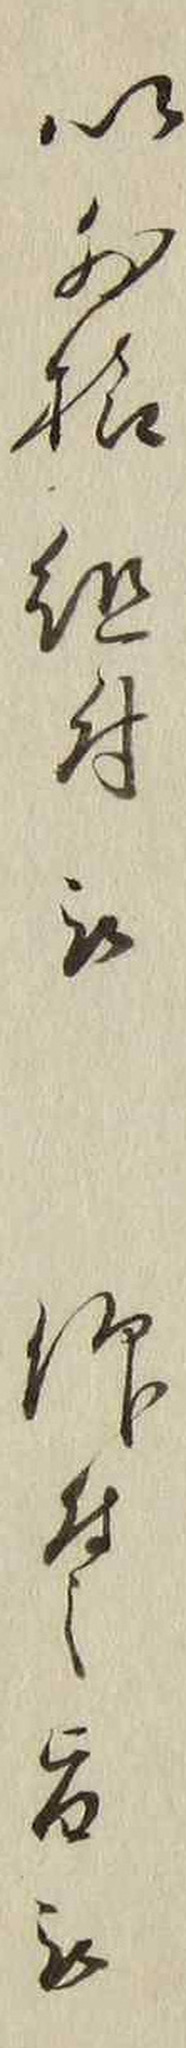以外様組付被仰付之旨被
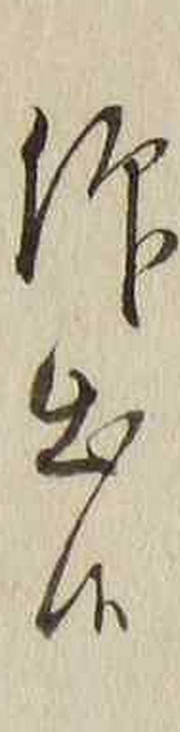仰出候
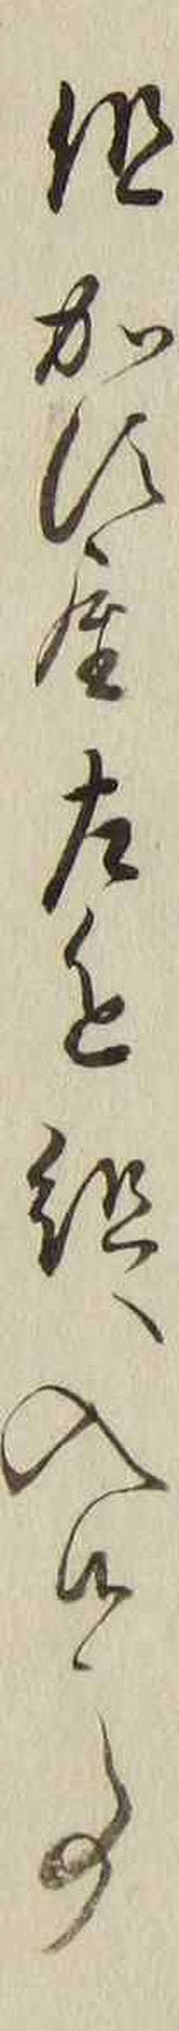但加須屋左近組へ入候事

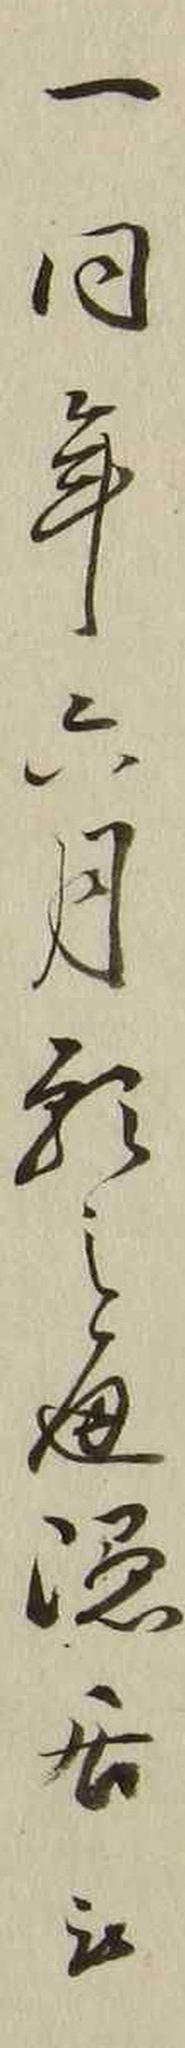一同年六月願之通隠居被
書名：諸士系譜　巻之52　に之部3
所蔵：会津若松市立会津図書館
